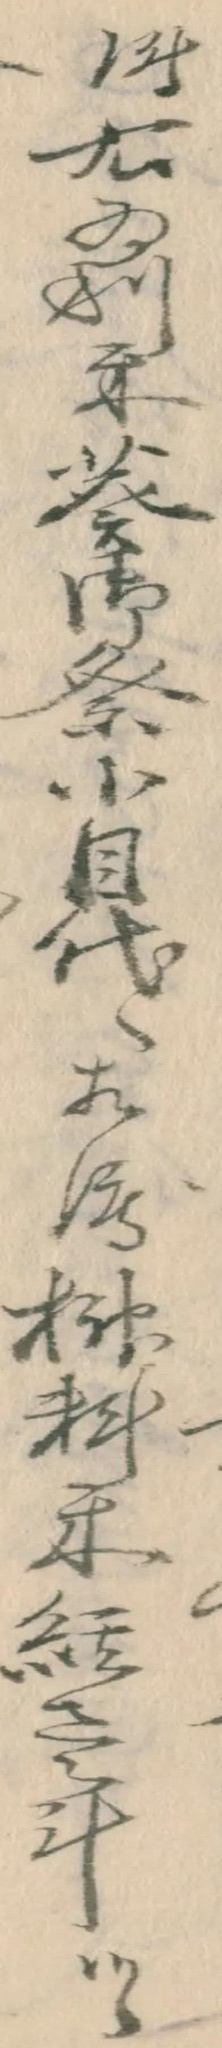附右為刈米葵御祭小目代へ相渡桝科米経壱斗ツヽ
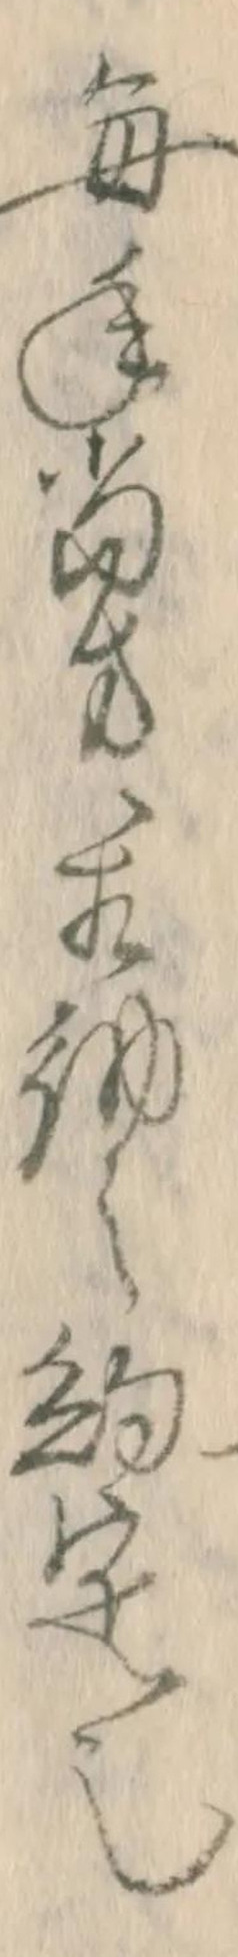毎年當方へ相納之約定也
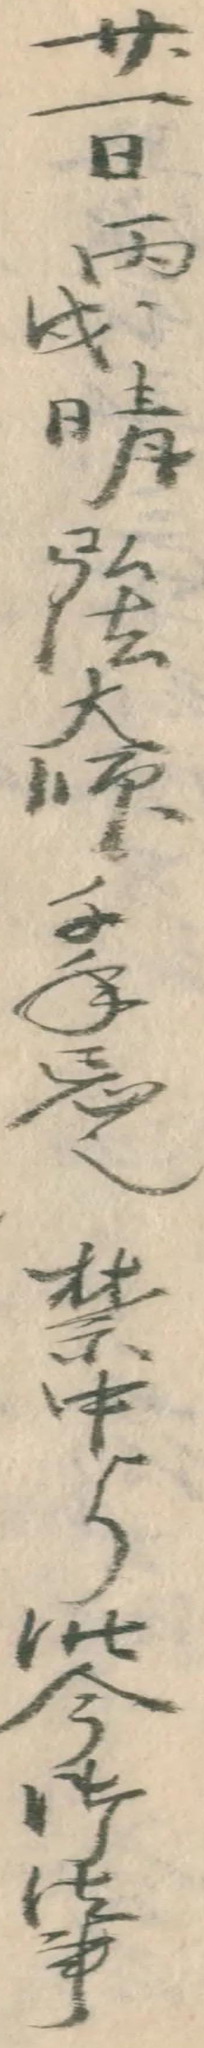廿一日丙戌晴弘法大師千年忌也禁中より昨今御法事
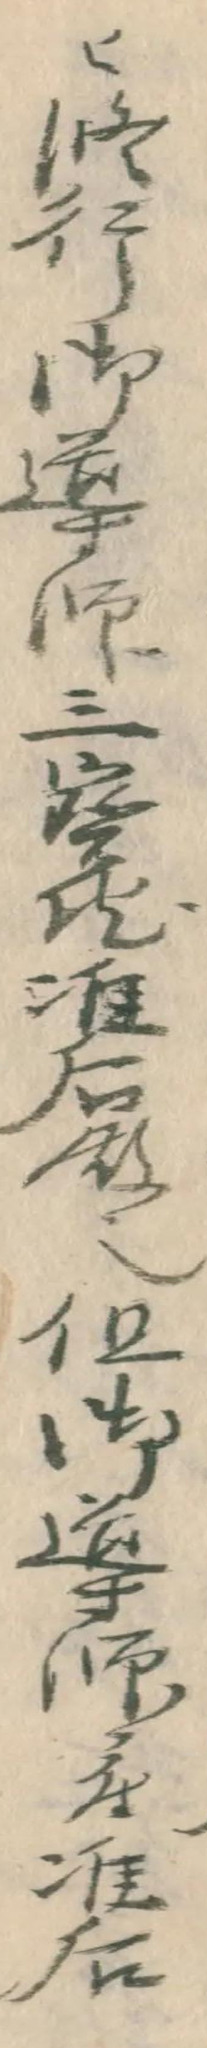被修行御導師三察院准后殿也但御導師ニ付准后
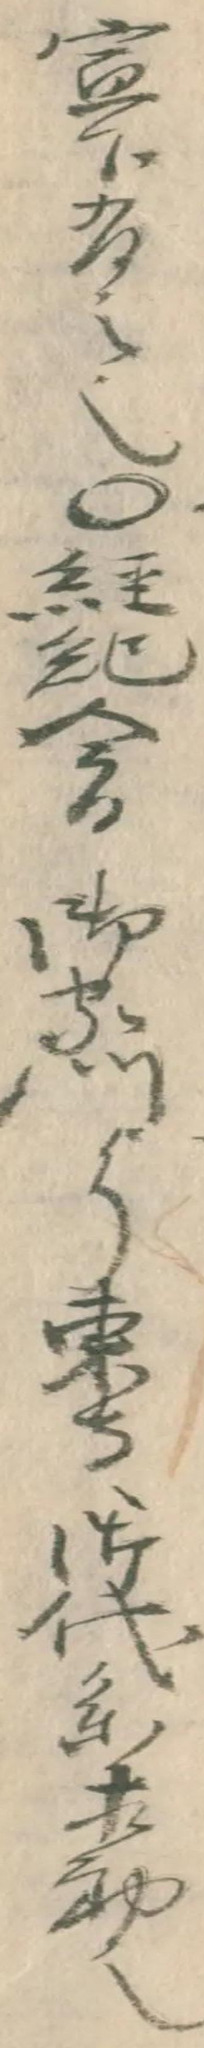宣下有之也○経紀今日御家門より東寺へ御代参相勤也

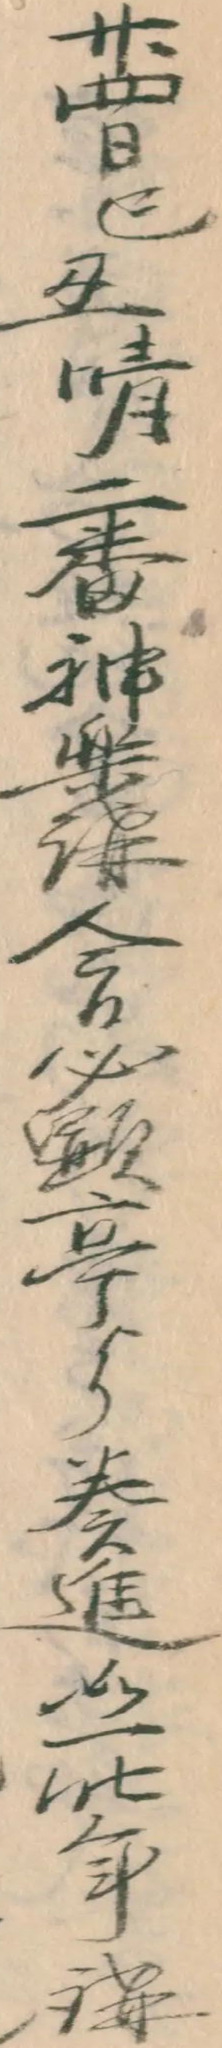廿四日己丑晴二番神楽講今日必顕亭より奏進如一昨年講
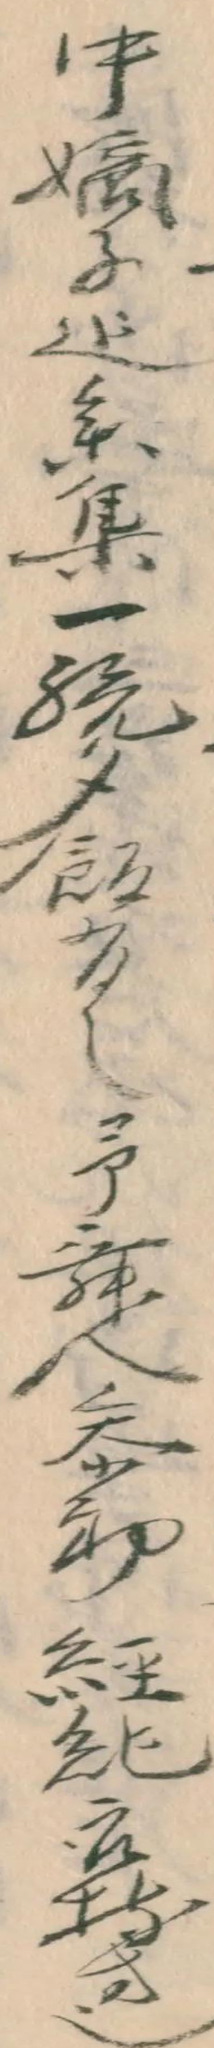中嫡子迄参集一統夕飯有之予舞人参勤経紀取持方也
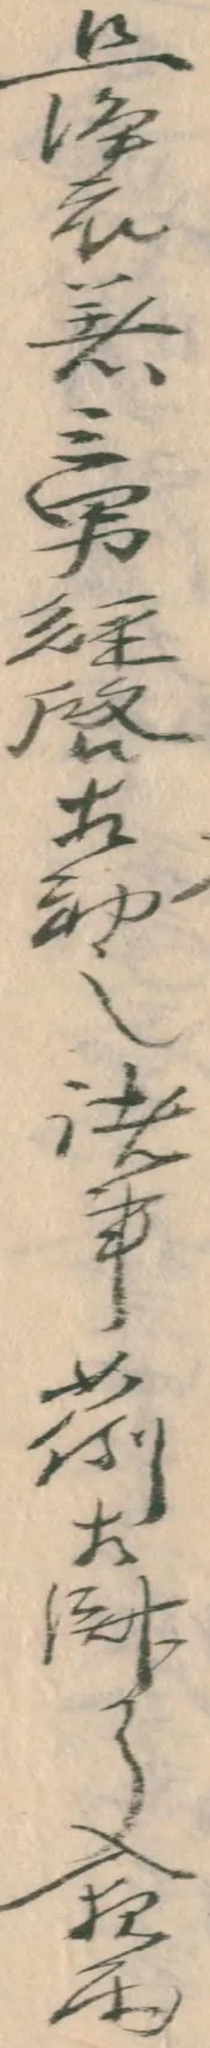且浄衣着三男経啓相勤也諸事如例相済了入夜雨
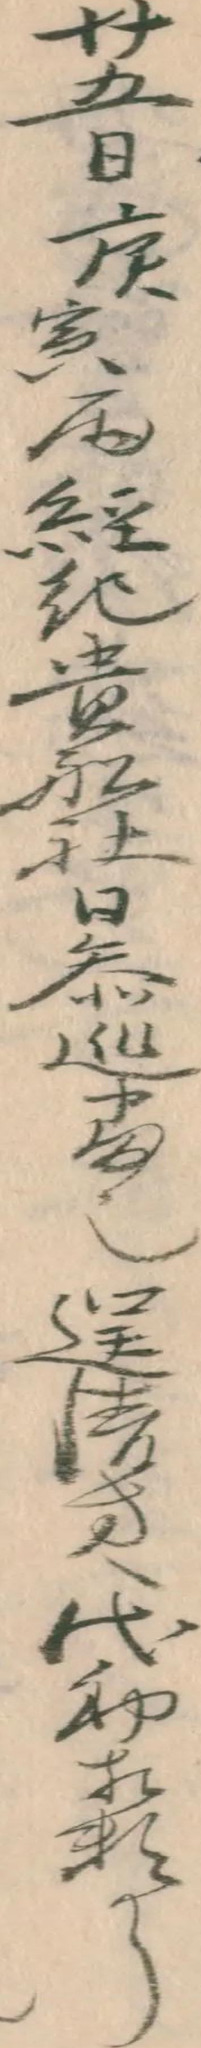廿五日庚寅雨経紀貴舩社日参巡番也逞清方へ代勤相頼了
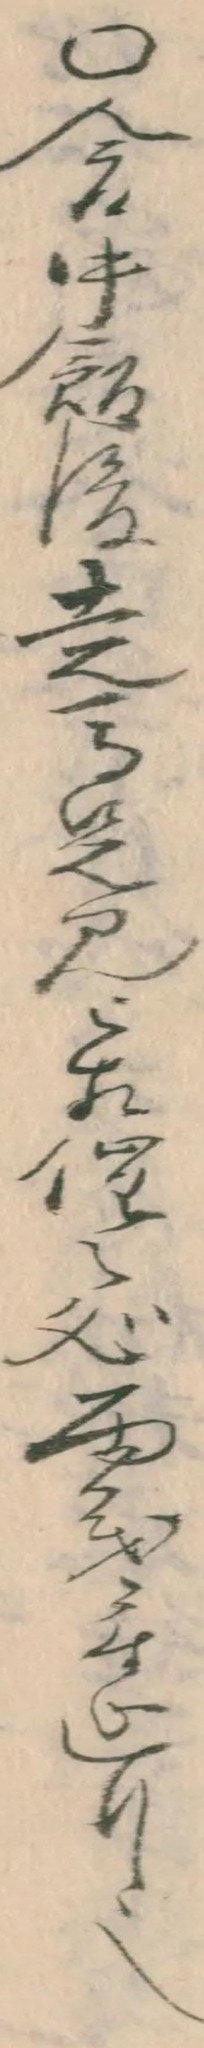○今日中飯後走馬足見被相催候処両義ニ付延引也
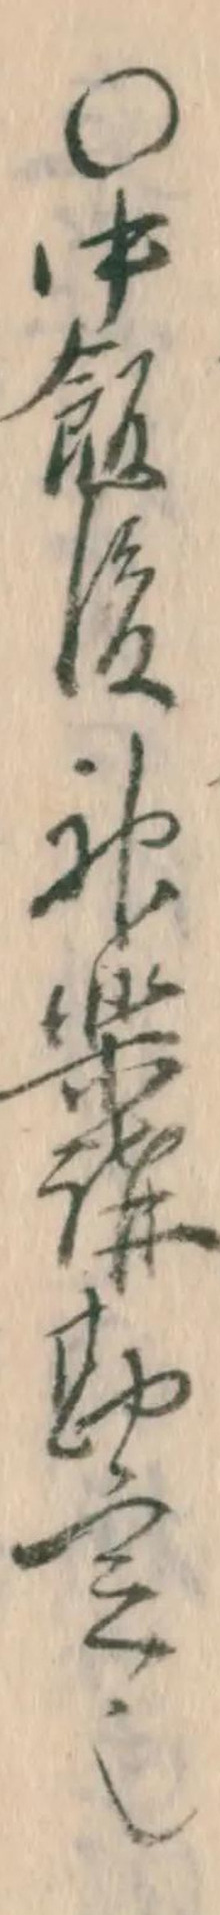○中飯後神楽講勘定也
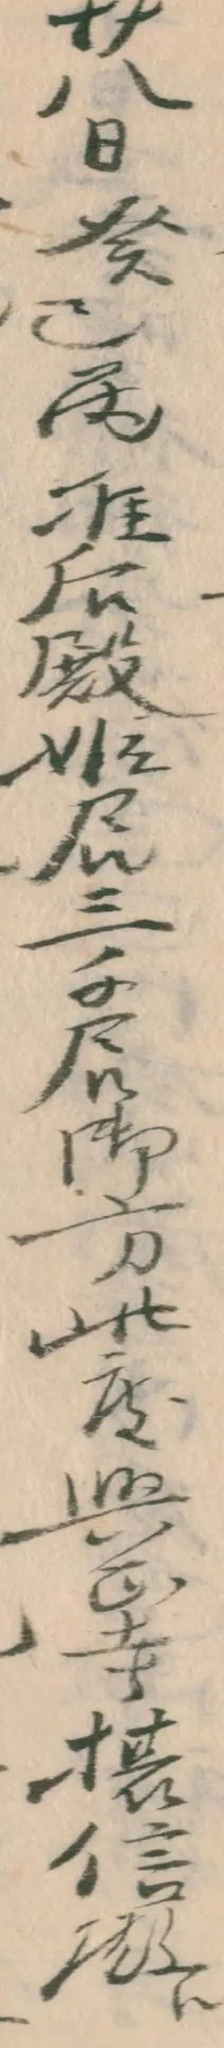廿八日癸巳雨准后殿姫君三千居御方此度興正寺猿信殿え
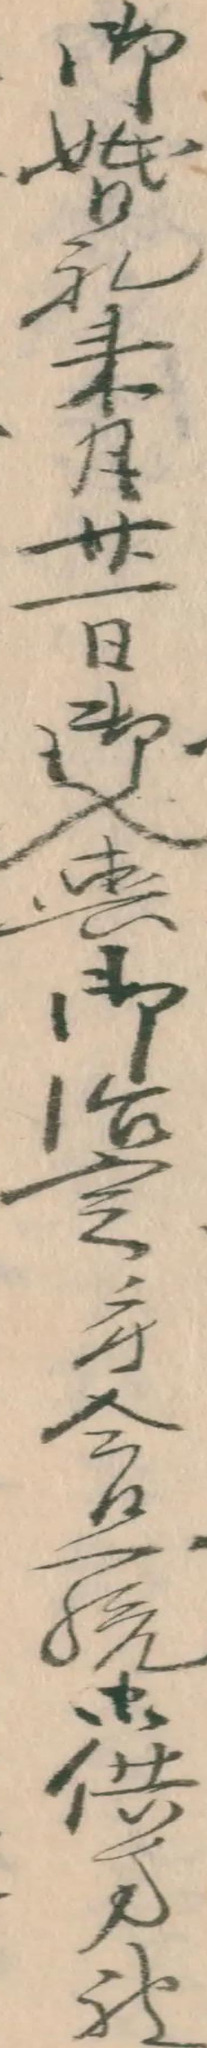御婚礼来月廿一日御入輿御治定ニ付合一統御供方被
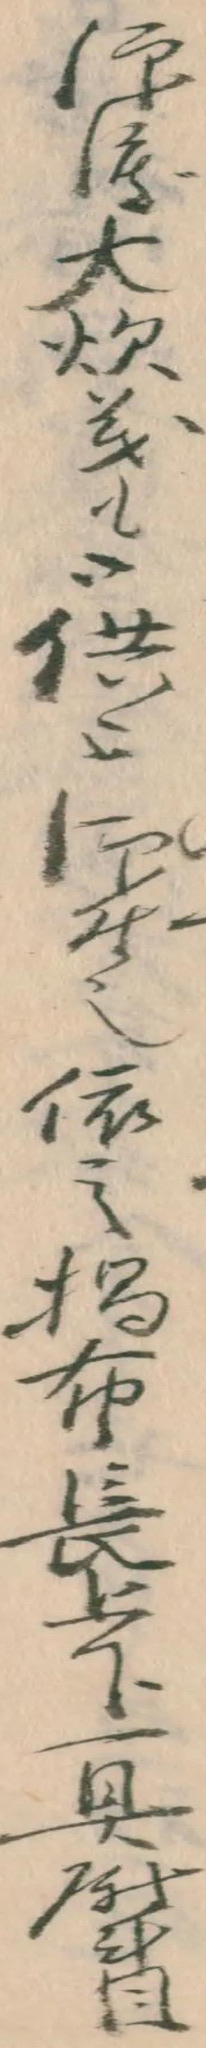仰渡大炊義も御供被仰付也依之掲布長上下一具熨目
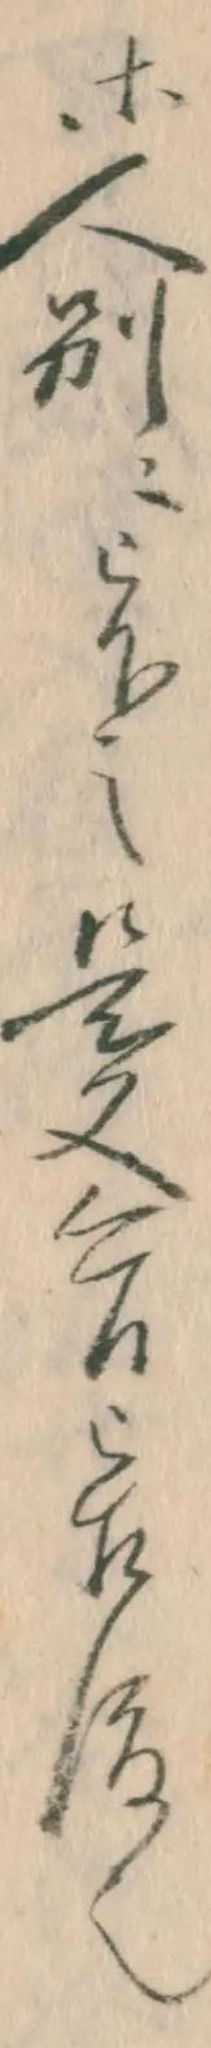等人別ニ被下之是又今日被召渡之
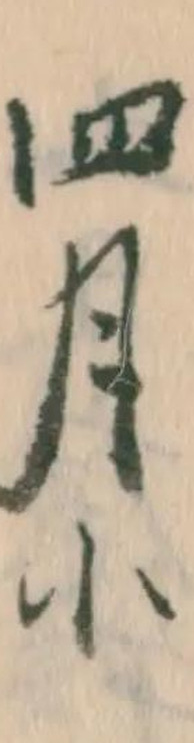四月小
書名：賀茂社記録. 第66冊
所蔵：国立国会図書館 National Diet Library, JAPAN
